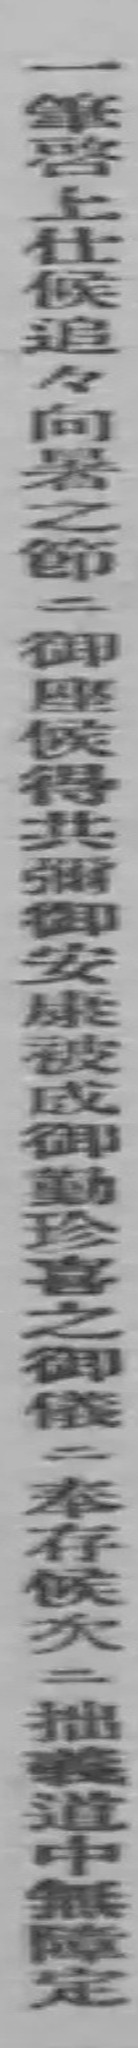一筆啓上仕候追々向暑之節ニ御座候得共彌御安康被成御勤珍喜之御儀ニ奉存候次ニ拙義道中無障定
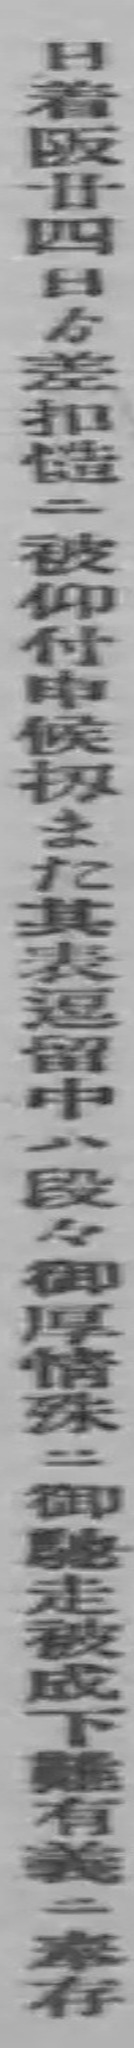日着阪廿四日ゟ差扣慥ニ被仰付申候扨また其表逗留中ハ段々御厚情殊ニ御馳走被成下難有義ニ奉存
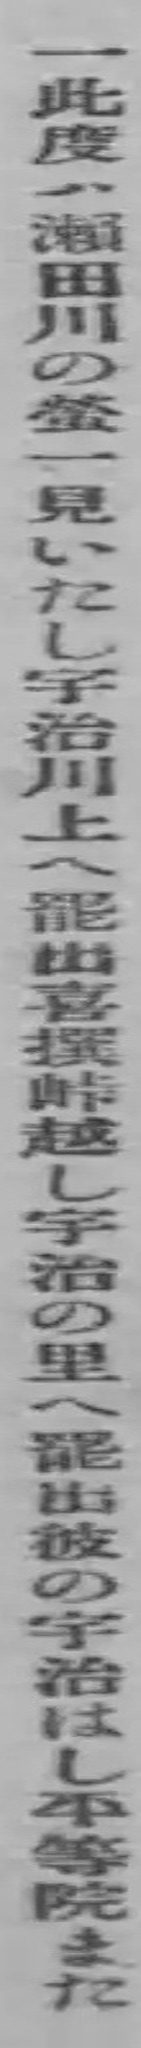一此度ハ瀬田川の蛍一見いたし宇治川上へ罷出喜撰峠越し宇治の里へ罷出彼の宇治はし平等院また
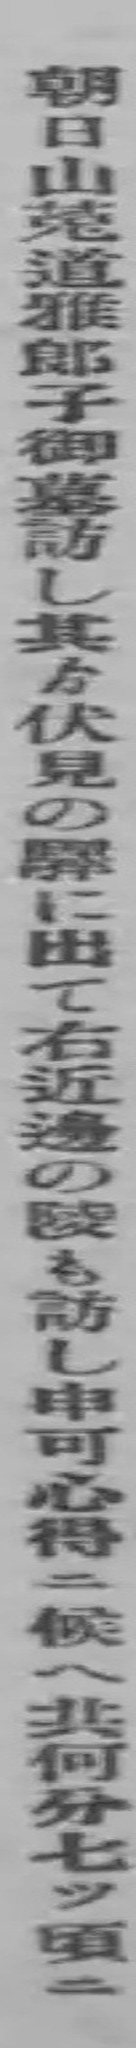朝日山兎道雅郎子御墓訪し其ゟ伏見の駅に出て右近辺の陵も訪し申可心得ニ候へ共何分七ツ頃ニ
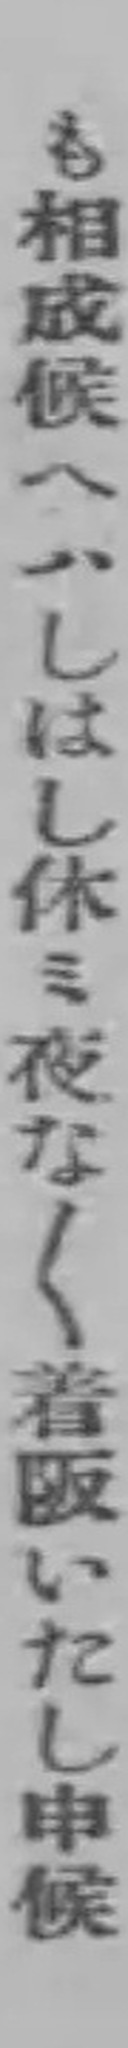も相成候へハしはし休ミ夜な〳〵着阪いやし申候
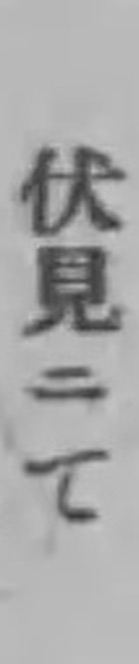伏見ニて
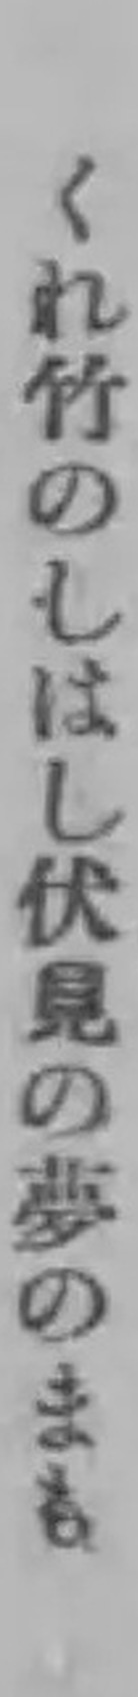くれ竹のしはし伏見の夢のまも
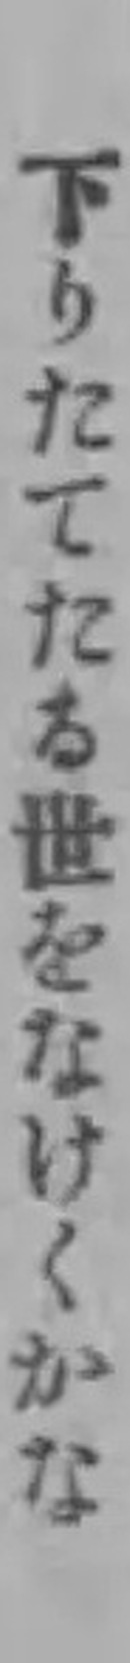下りたてたる世をなけくかな

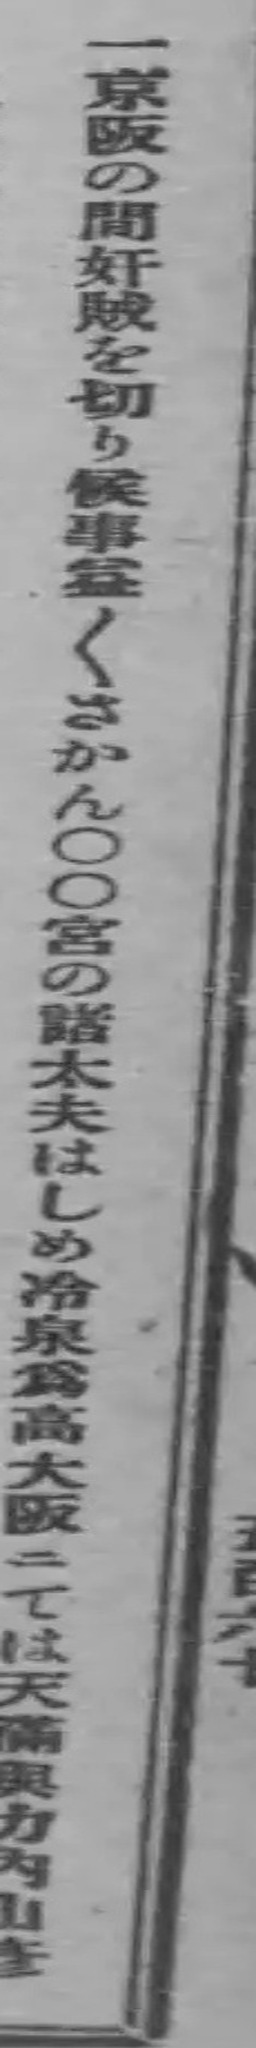一京阪の間奸賊を切り候事益〳〵さかん○○宮の諸太夫はしめ冷泉為高大阪ニては天満与力内山彦
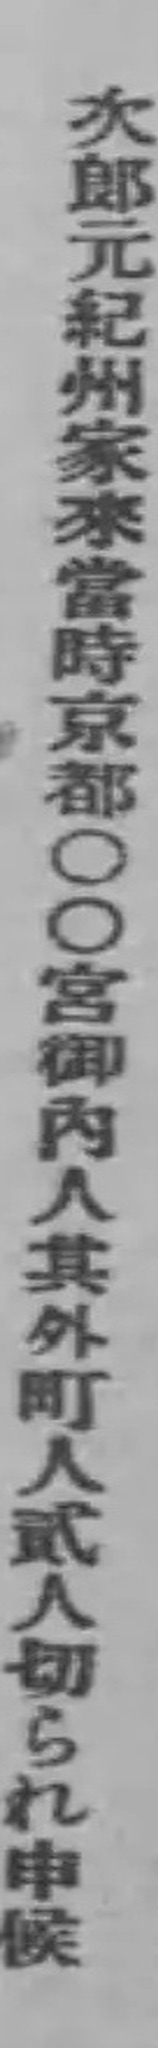次郎元紀州家来当時京都○○宮御内人其外町人弐人切られ申候
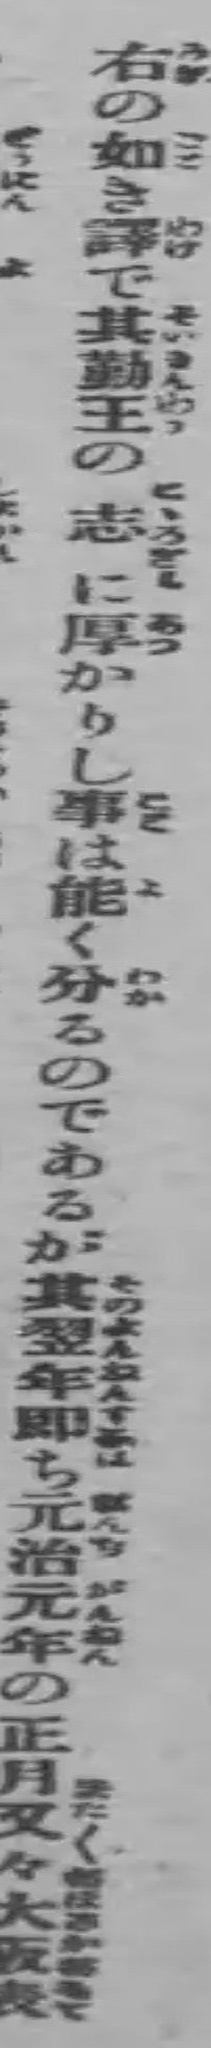右の如き訳で其勤王の志に厚かりし事は能く分るのであるが其翌年即ち元治元年の正月又々大阪表
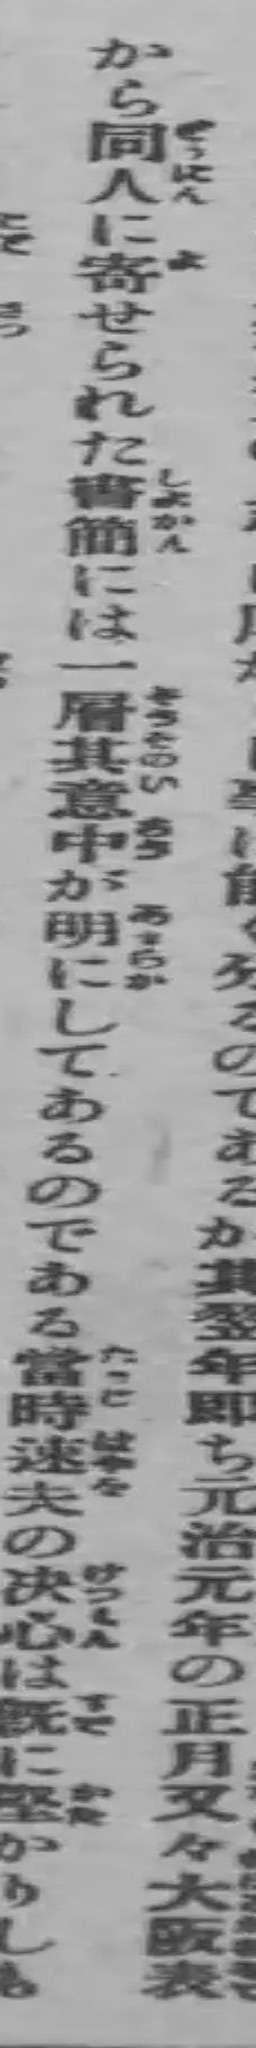から同人に寄せられた書簡には一層其意中が明にしてあるのである当時速夫の決心は既に堅かりしも
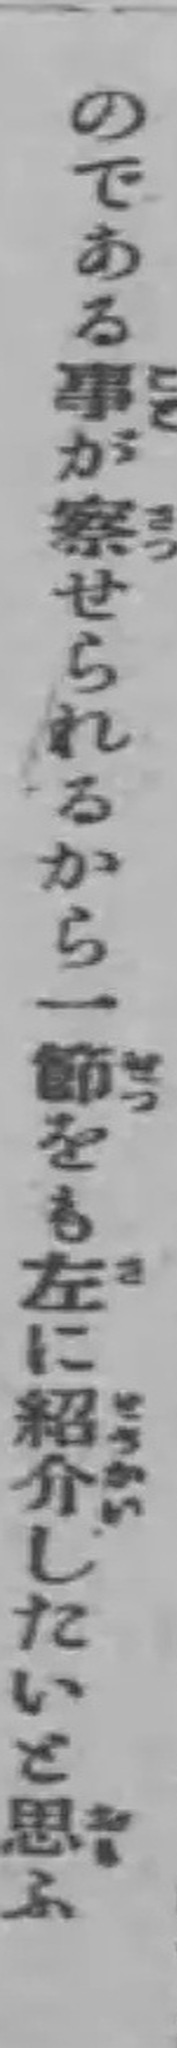のである事が察せられるから一節をも左に紹介したいと思ふ
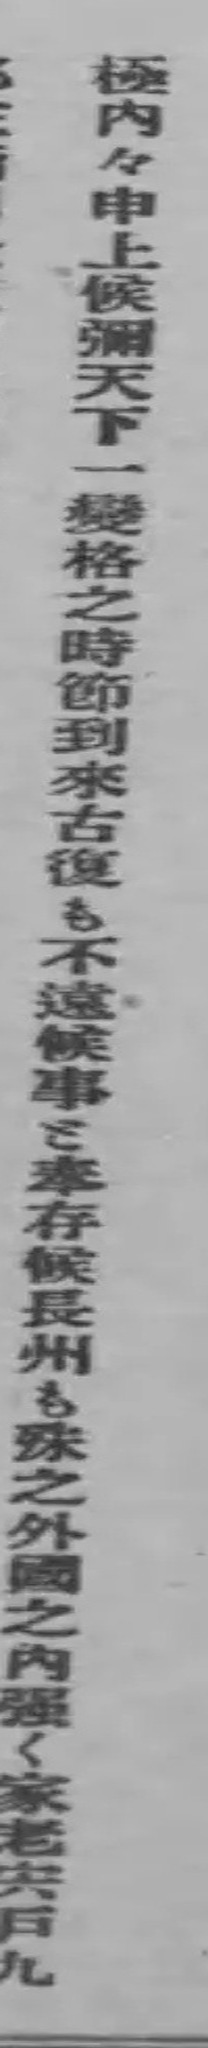極内々申上候彌天下一変格之時節到来古復も不遠候事と奉存候長州も殊之外国之内強く家老宍戸九
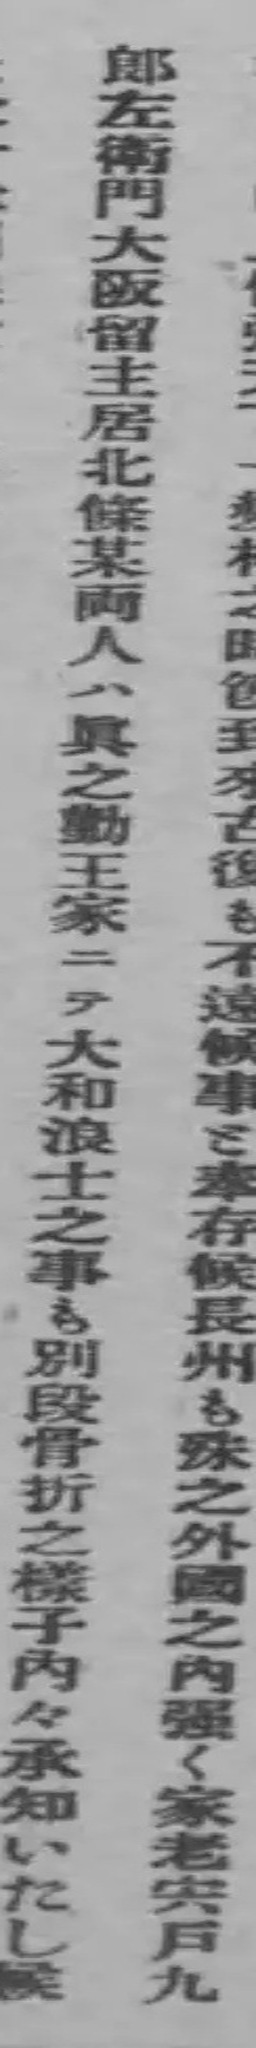郎左衛門大阪留主居北條某両人ハ真之勤王家ニテ大和浪士之事も別段骨折之様子内々承知いたし候
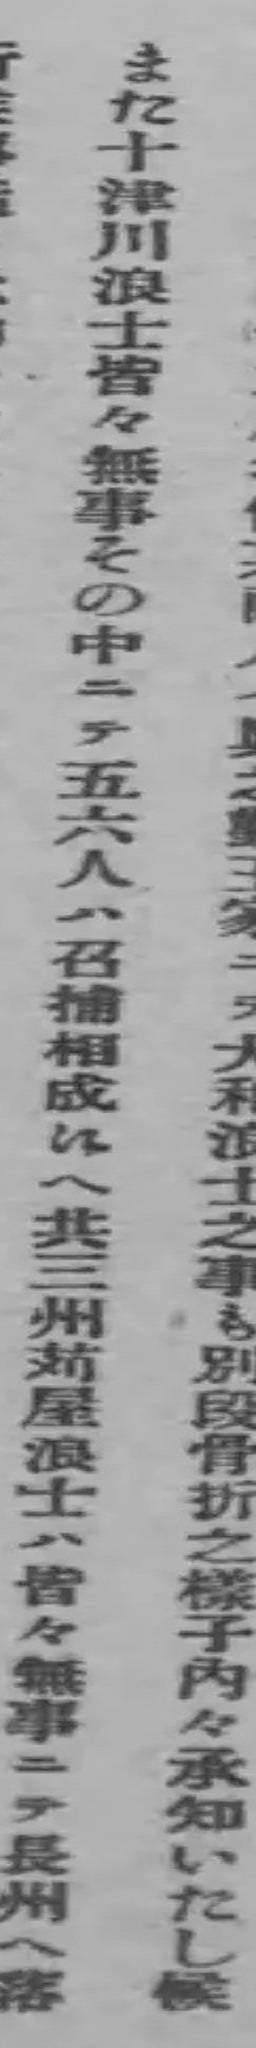また十津川浪士皆々無事その中ニテ五六人ハ召捕相成候へ共三州苅屋浪士ハ皆々無事ニテ長州へ落
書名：豊橋市史談
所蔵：国立国会図書館 National Diet Library, JAPAN
